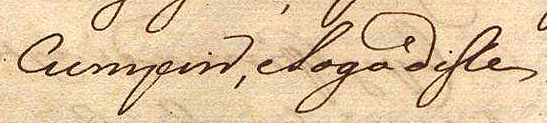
Cumprir, e logo disse
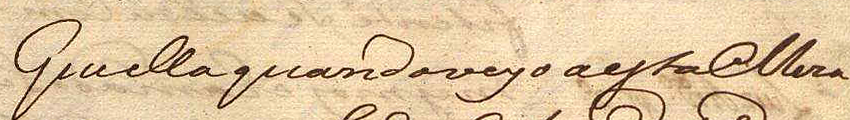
Que ella quando veyo a esta Meza
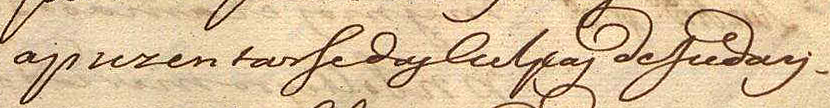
aprezentarse das Culpas de Judais
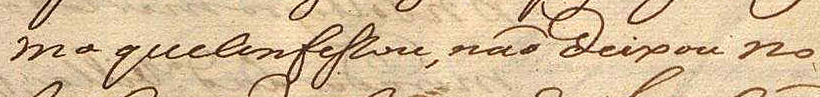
mo que confessou, naõ deixou no
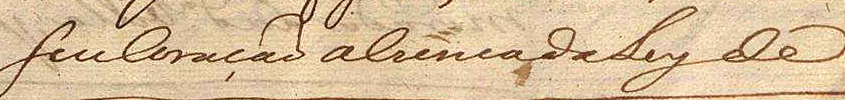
seu Coraçaõ a Crenca da Ley de
